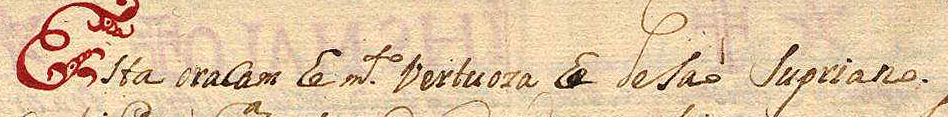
Esta oraçam he m.to vertuoza, he de Saõ Supriano.
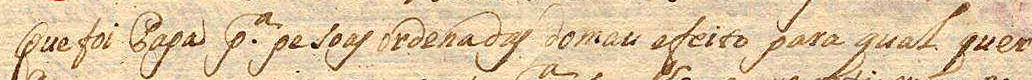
Que foi Papa p.a pesoas ordenadas do mau effeito para qualquer
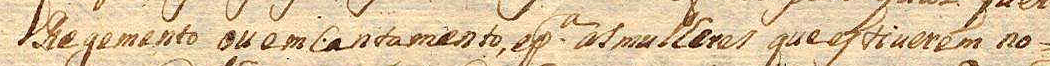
Regemento ou emcantamento, e p.a as mulheres que estiuerem no
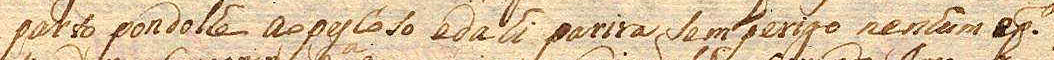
parto, pondolhe ao pescoso e dahi parira sem perigo nenhum e p.a
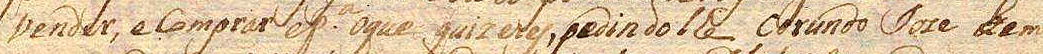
vender, e comprar e p.a o que quizeres, pedindolhe Corundo Ioze e em
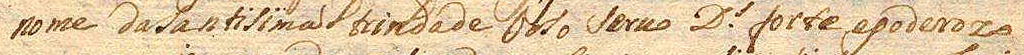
nome da Santisima trindade Voso seruo D.s forte e poderozo
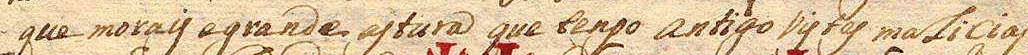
que morais a grande astura que tenpo antigo vistes maLicias
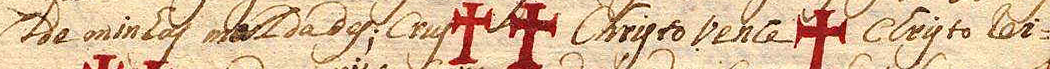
de minhas maldades; Crus †† Christo vence † Christo Rei
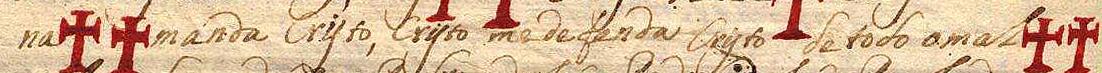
na †† manda Cristo, Cristo me defenda Cristo de todo o mal ††
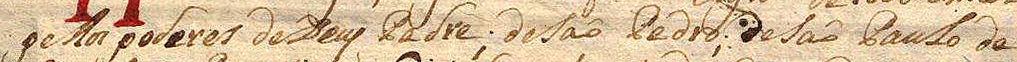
pellos poderes de Deus Padre; de Saõ Pedro; de Saõ Paulo de
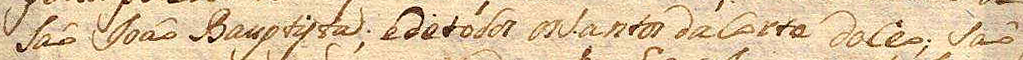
Saõ Ioaõ Bauptista; e de todos os Santos da Corte do Ceo, Saõ
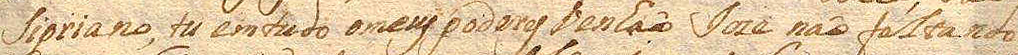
Sipriano, tu em tudo o meus poderes venhaõ Ioze naõ faltando
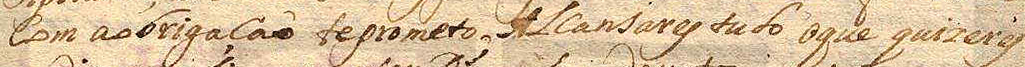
Com a obrigaçaõ te prometo Alcansares tudo o que quizeres
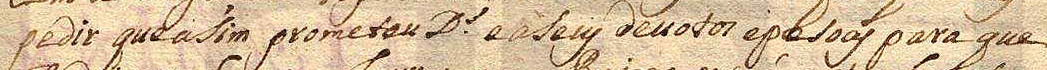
pedir que asim prometeu D.s aa seus deuotos e pesoas para que
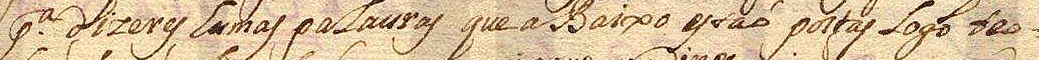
p.a dizeres, humas palauras que aBaixo estaõ postas Logo te o
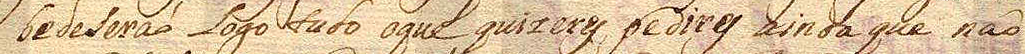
bedeseraõ Logo tudo o que quizeres pedires ainda que naõ
